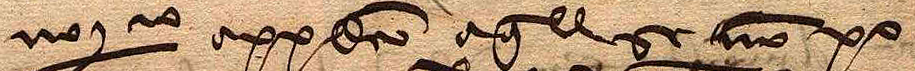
notro appllco a q̄ll se nō po
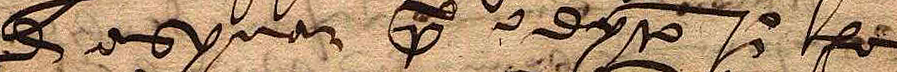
de asynar p̄o o dyto Jmo ha
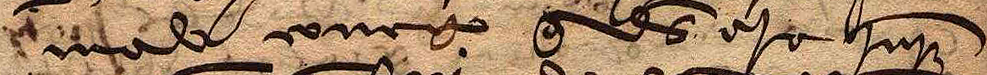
mado conego q̄ ds̄ aja jujz
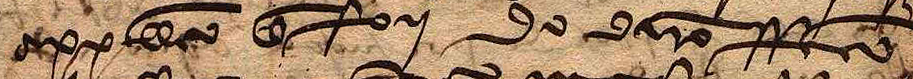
appllco q̄ foy do dito ffec̄o
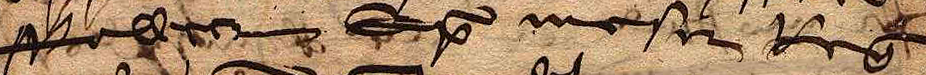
ffallecer E p̄o me ser Req̄
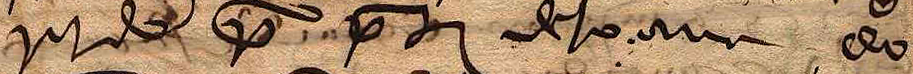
rydo p̄o p̄te de Joana llo
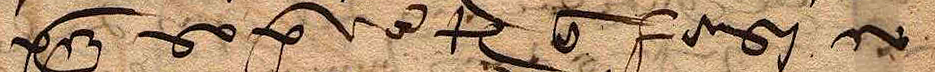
pez sop̄cāte q̄ hasy co
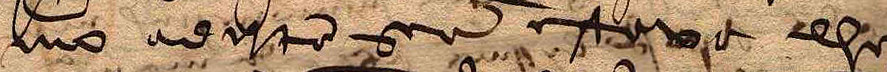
mo a dyta sçā estava lhe
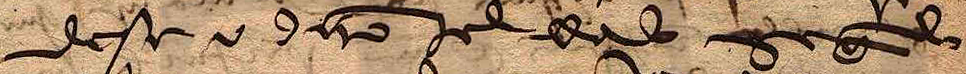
dese o dito terllado seḡdo
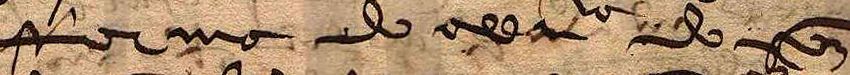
forma do allura do sōr
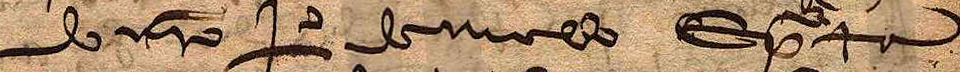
doutō Jo de mello E p̄otā
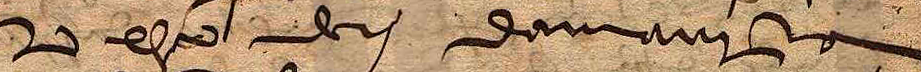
to lho dey da manrra
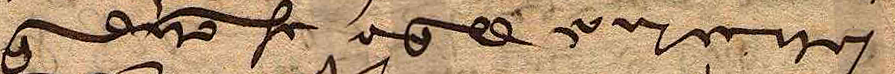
q̄ dito he o q̄ll comcertej
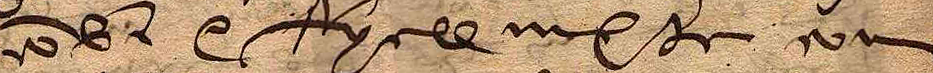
c̄o bē e ffyellmēte com
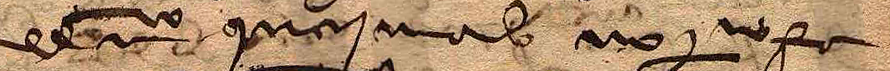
alluro queymado notro ha
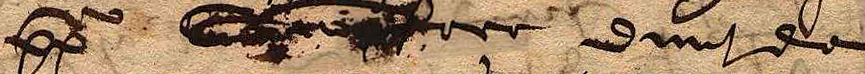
ppco E nō faça duujda
